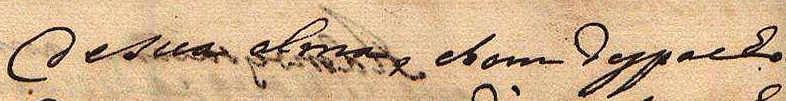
de sua alma, e bom despacho
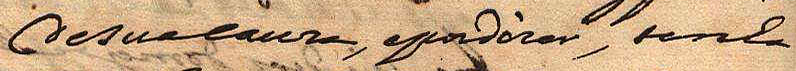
de sua cauza, e por dizer, tenha
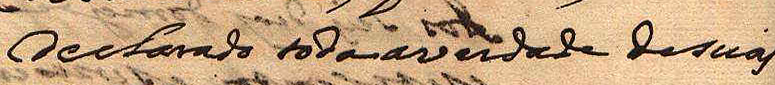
declarado toda a verdade de suas
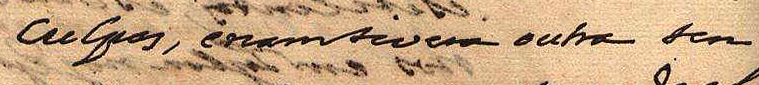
culpas, e nam tivera outra ten
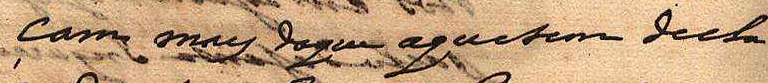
çam mais do que a que tem decla
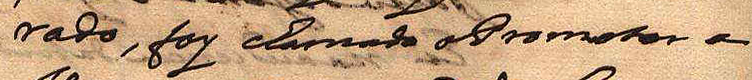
rado, foy chamado o Promotor a
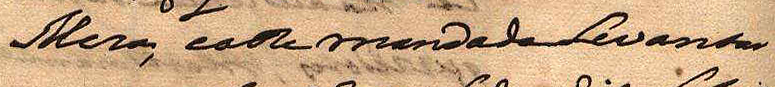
Meza, e a Re mandada Levantar
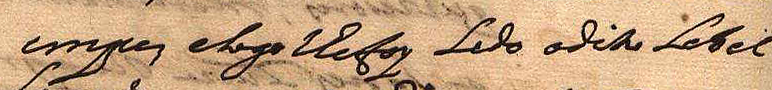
em pe, e logo lhe foy Lido o dito Lebel
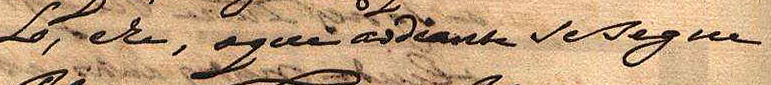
Lo, e he, o que aodiante se segue.
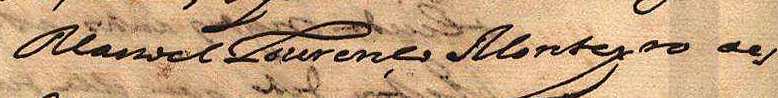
Manoel Lourenço Monteyro o es
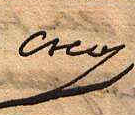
creuj
